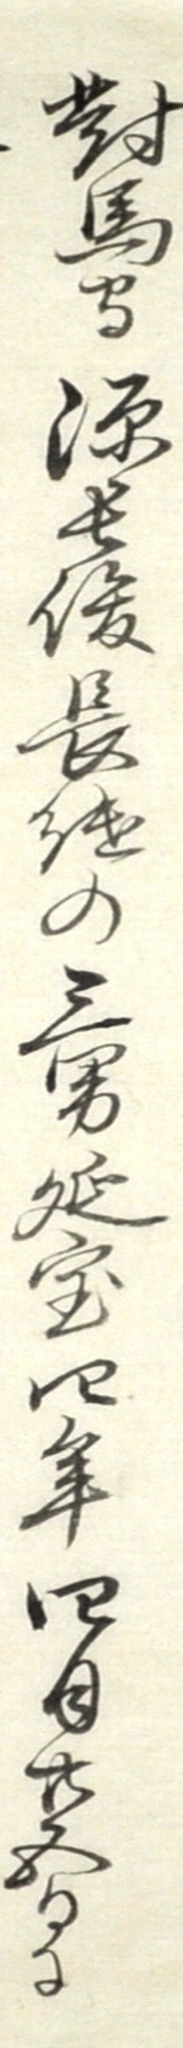対馬守源長俊長継の三男延宝四年四月廿五日に
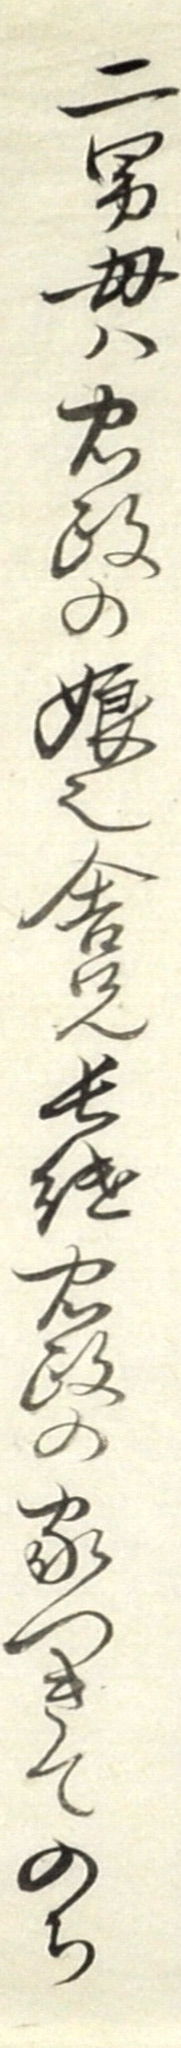二男母は忠政の娘也舎兄長継忠政の家つきてのち
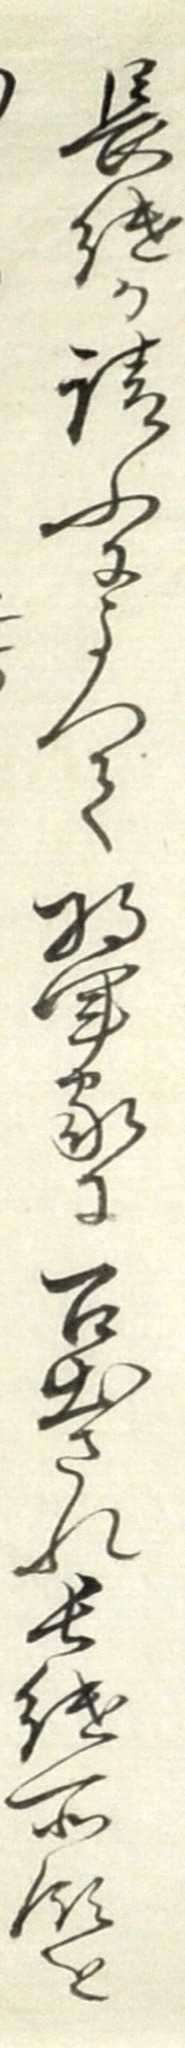長継か請ふによつて将軍家に召出され長継所領を
